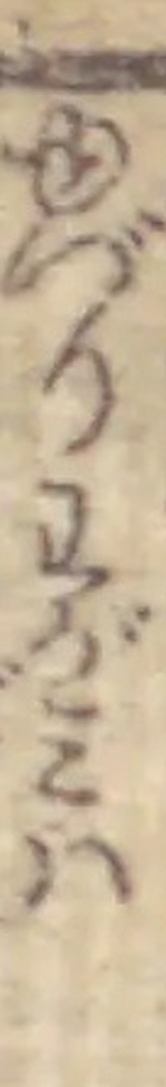ゆづりわがみは
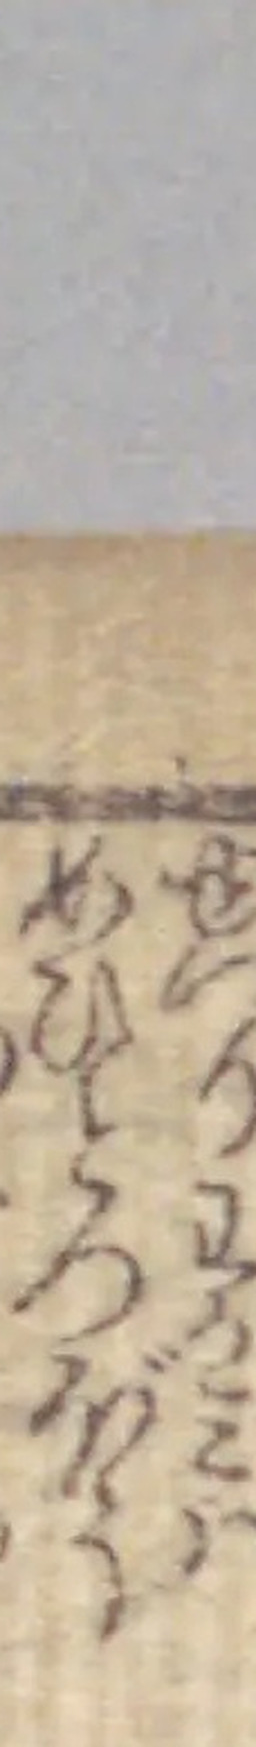めひとつぼう
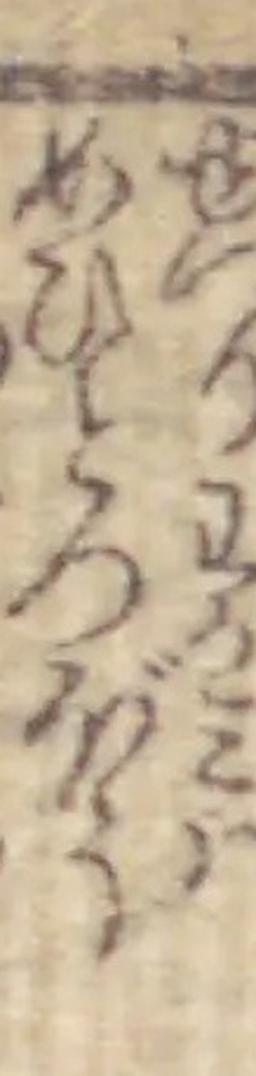めひとつぼう
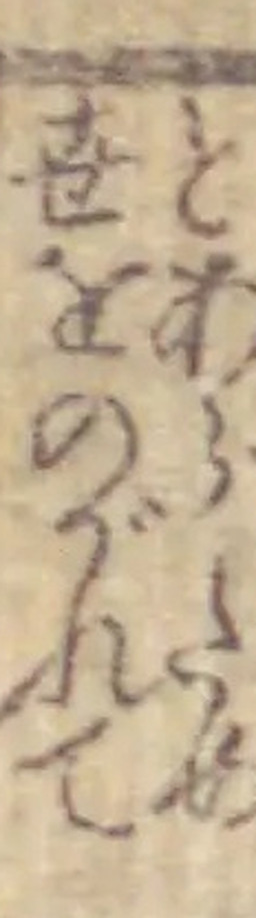世をのがれて

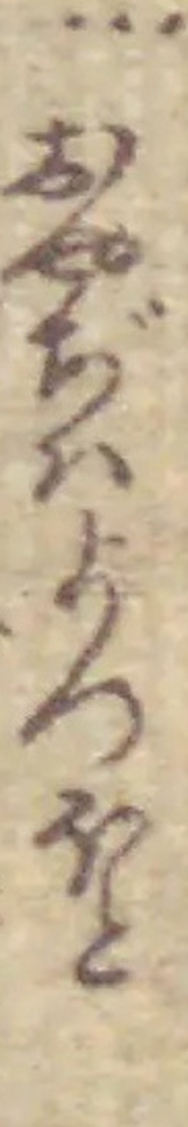おやぢはよつほと
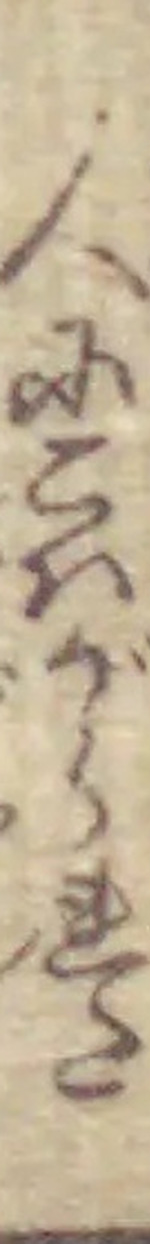人にこはがられた
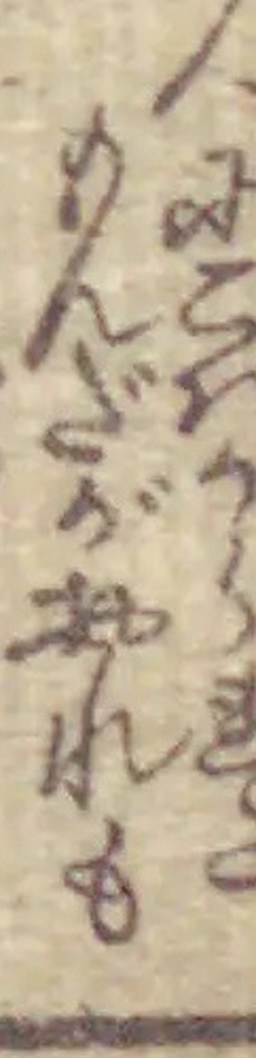もんだがおれも
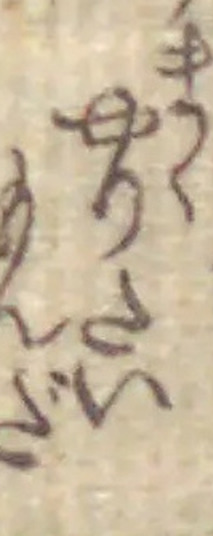やりたい
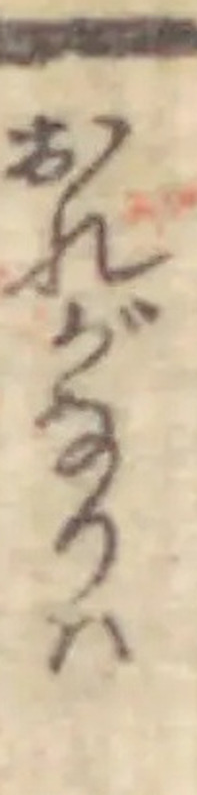おれがなりは
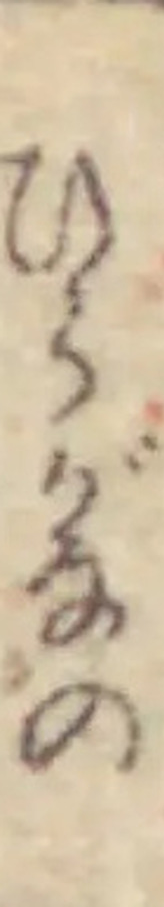ひらがなの
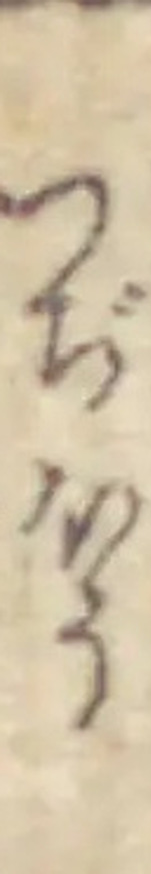つぢほう
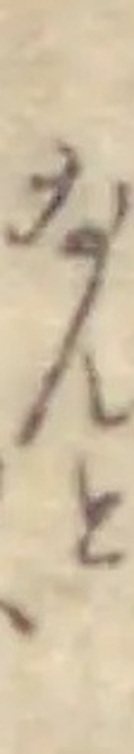ゐんと
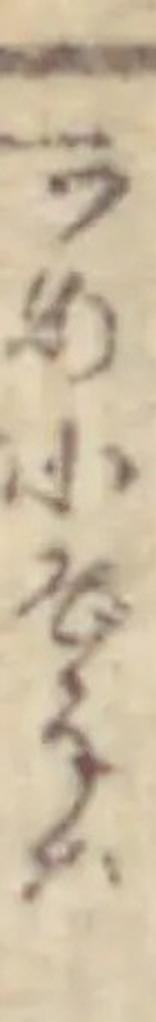一つめ小ぞうは
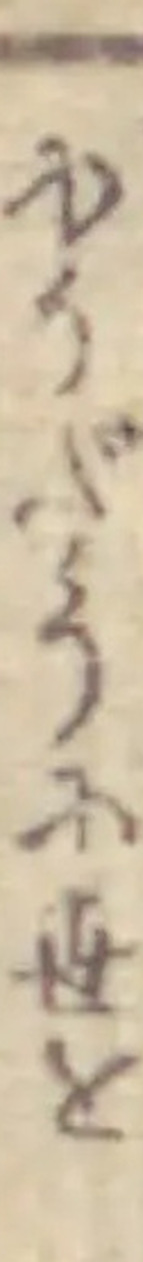にうだうに世を
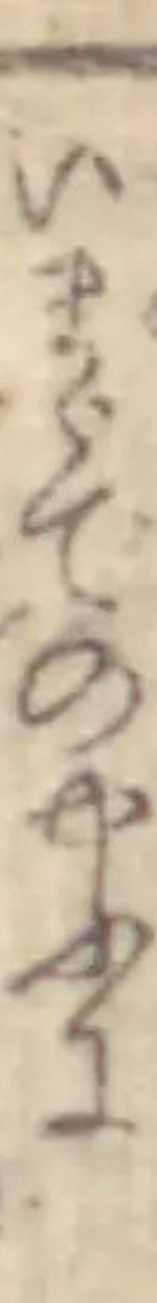いまゝでのやふに
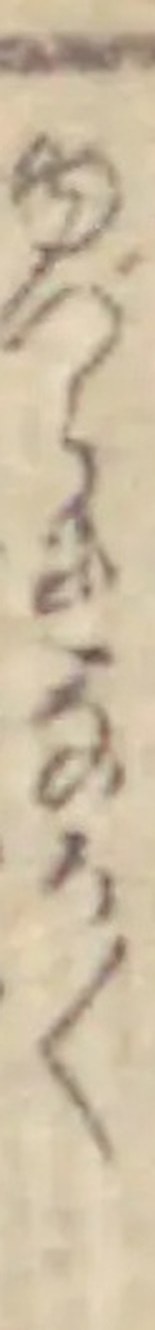ゆづられなか〳〵
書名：大昔化物双紙 2巻
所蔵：国立国会図書館 National Diet Library, JAPAN
